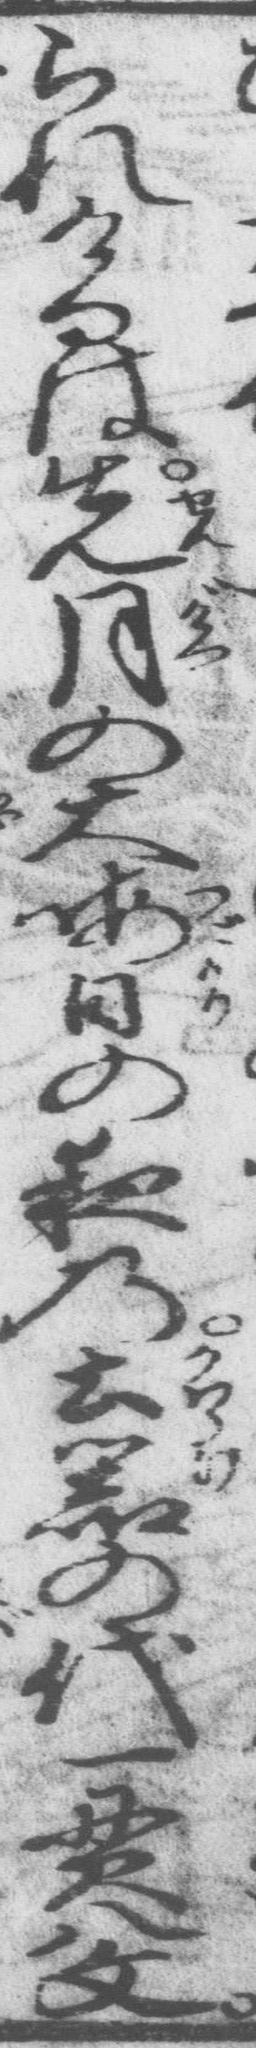られけるは。先月の大晦日の夜の。土器の代一貫八文。
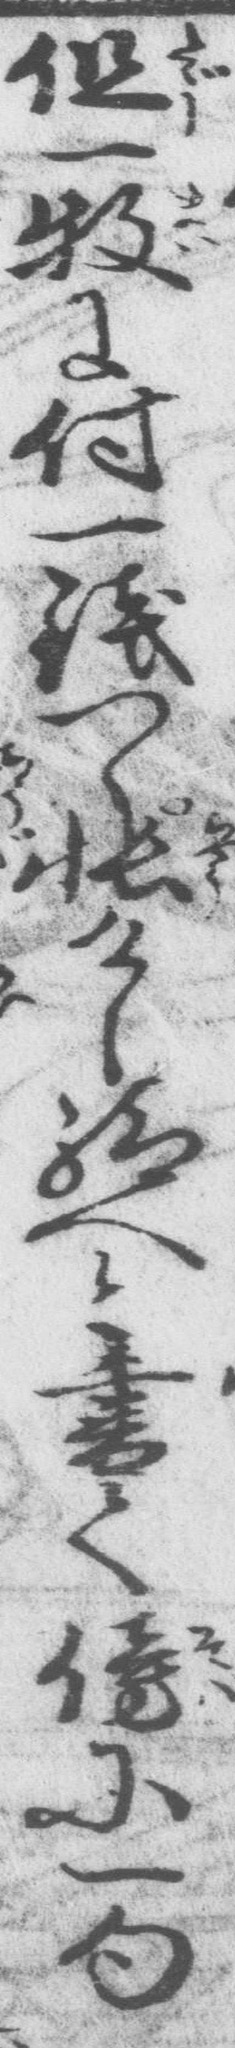但一枚に付一銭つゝ帳けし給へと書く傍に一句
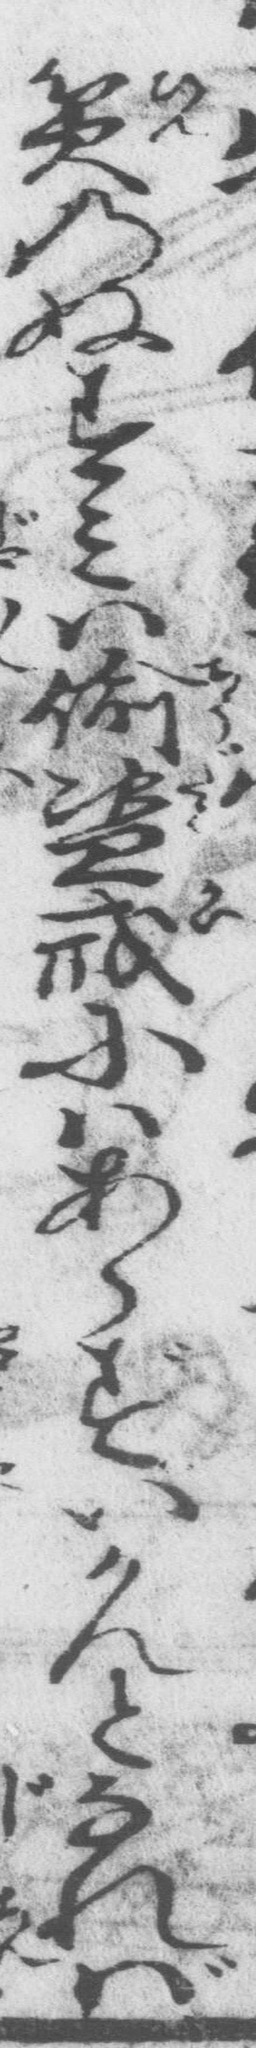貧のぬすみは偸盗戒にはあらずいかんとなれば
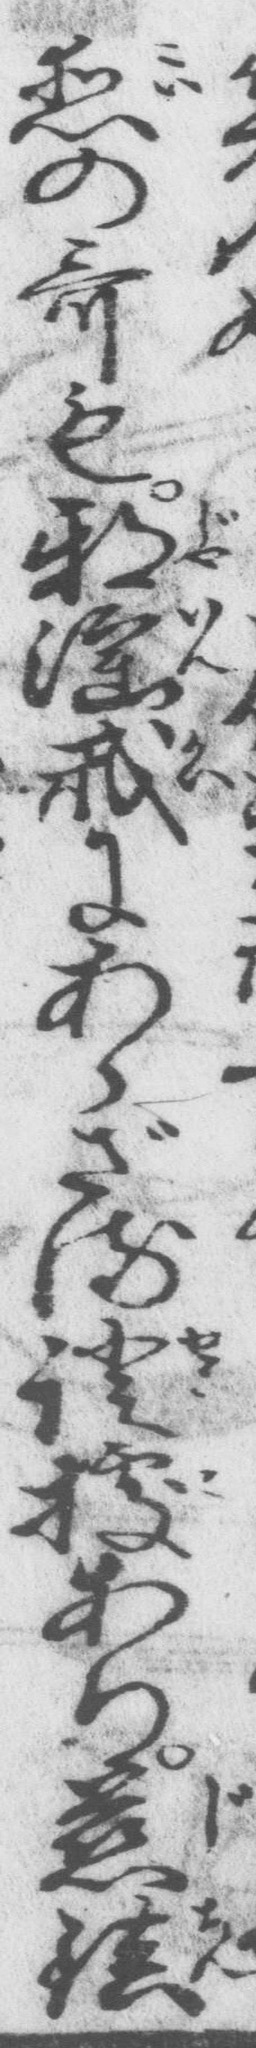恋の哥も。邪淫戒にあらざる証拠あり。慈鎮
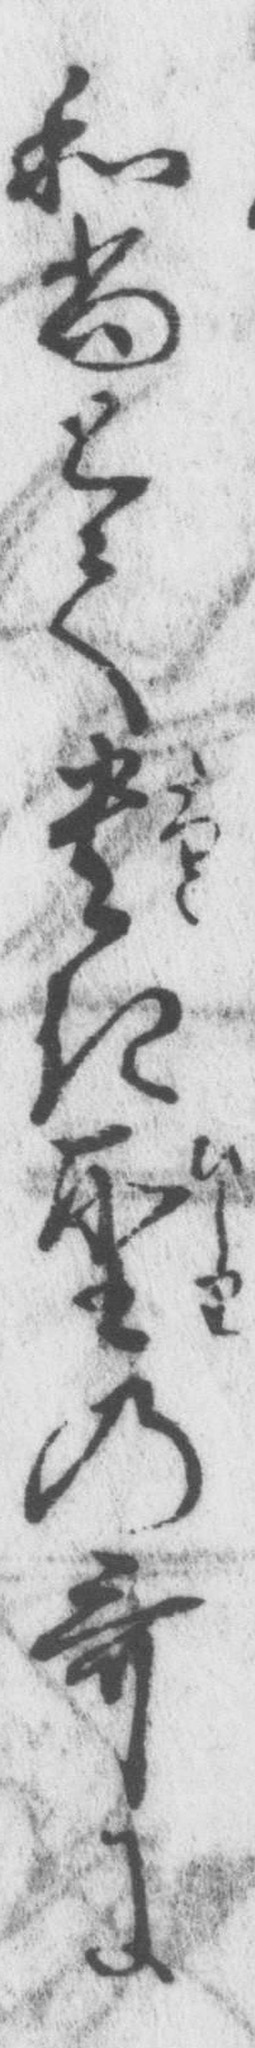和尚とて貴き聖の哥に
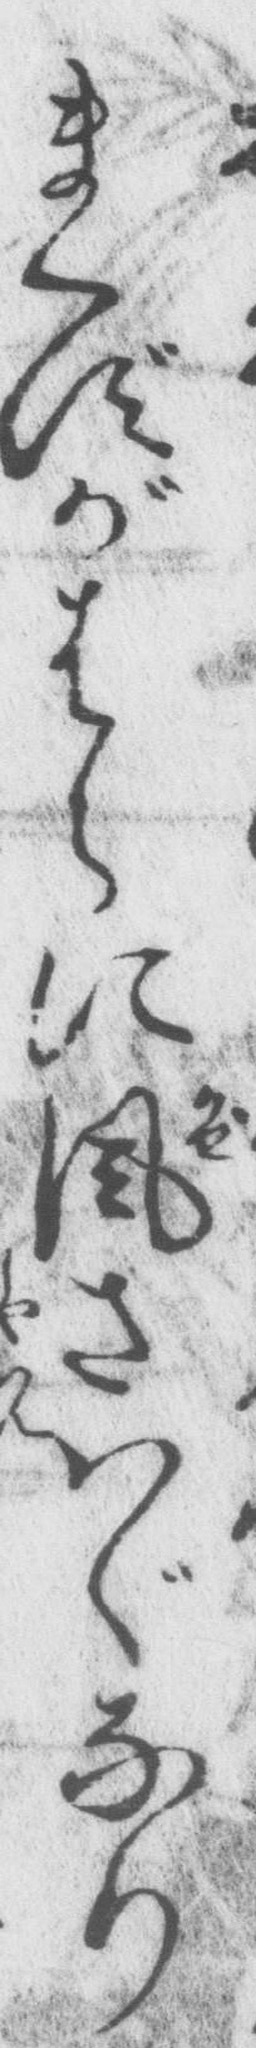まくずがはらに風さはぐなり
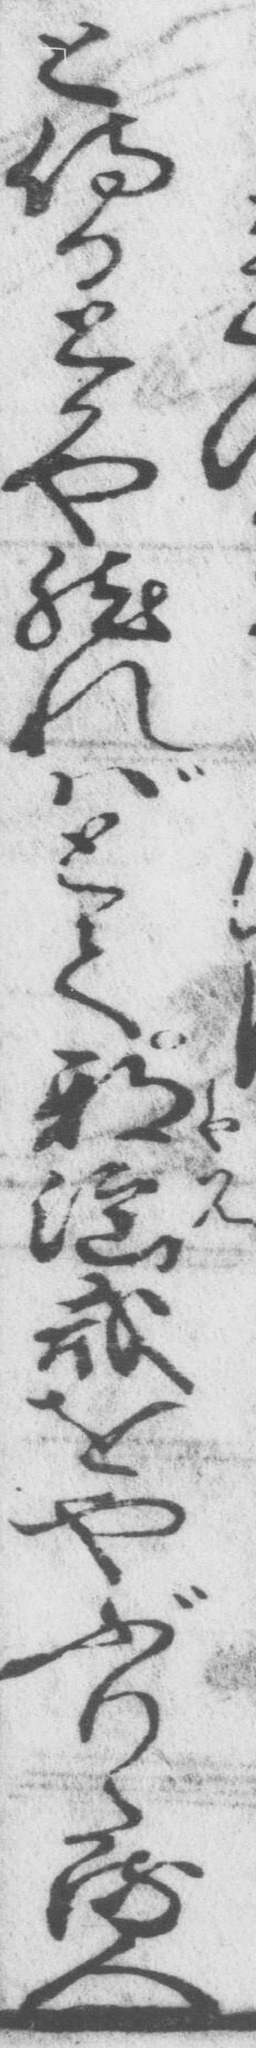と侍るとかや然ればとて。邪淫戒やぶりたる人
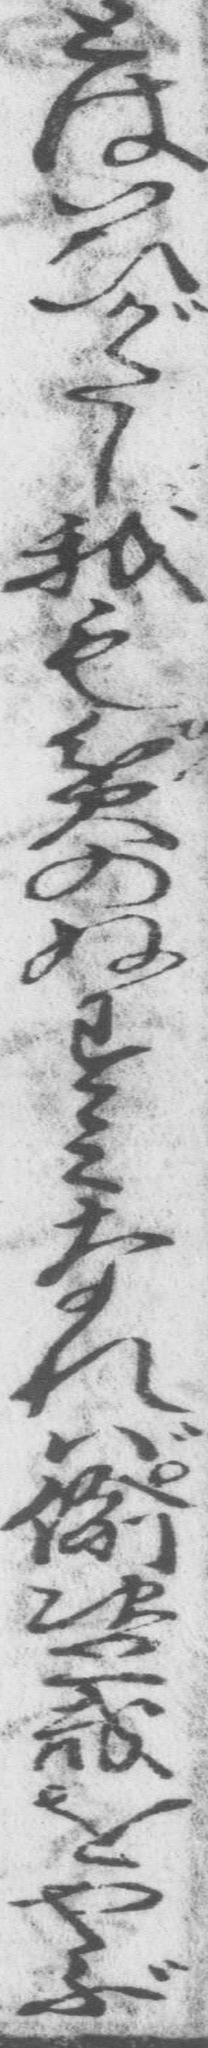とは思ひがたそ我も貧のぬすみなれば偸盗戒をやぶ
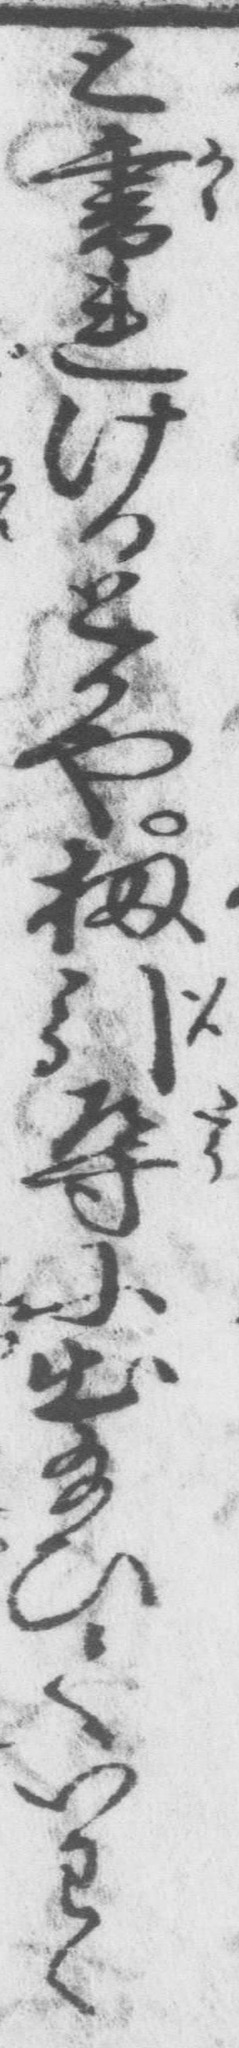と書れけるとかや。扨引導に出給ひていわく
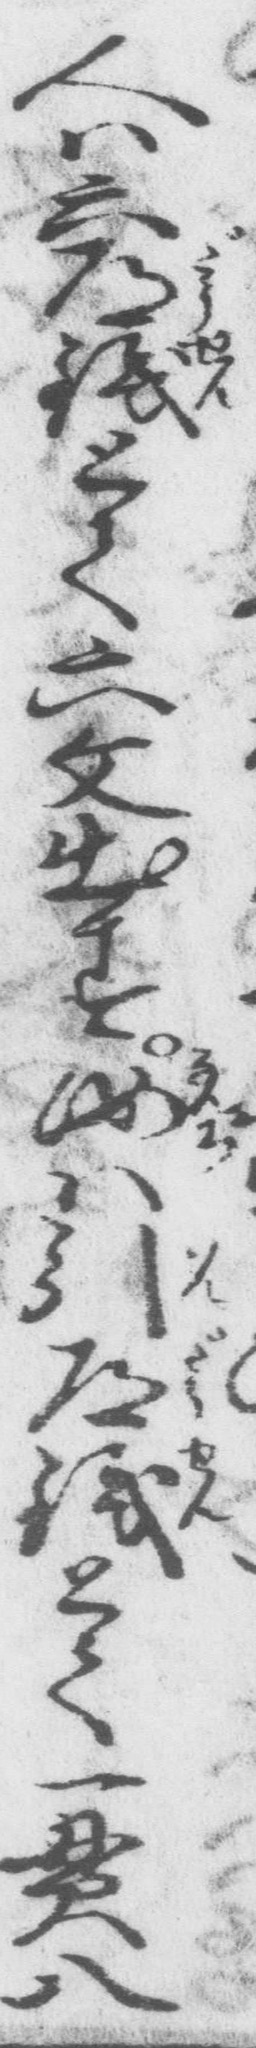人は六道銭とて六文出す。汝は引導銭とて一貫八
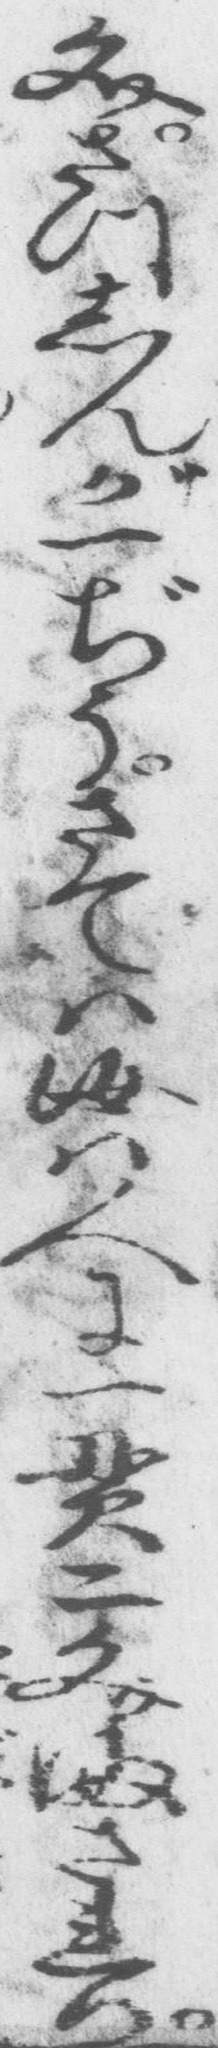文。さつしんが一ぢう。さては汝は人に一貫二文まされり。
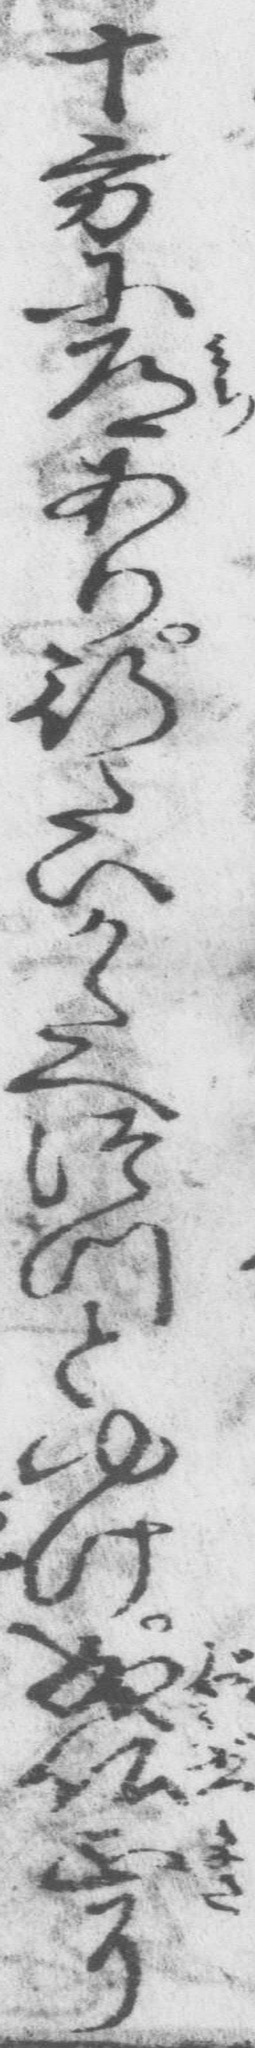十方に道あり。行たいかたへつつとゆけ。成仏正に
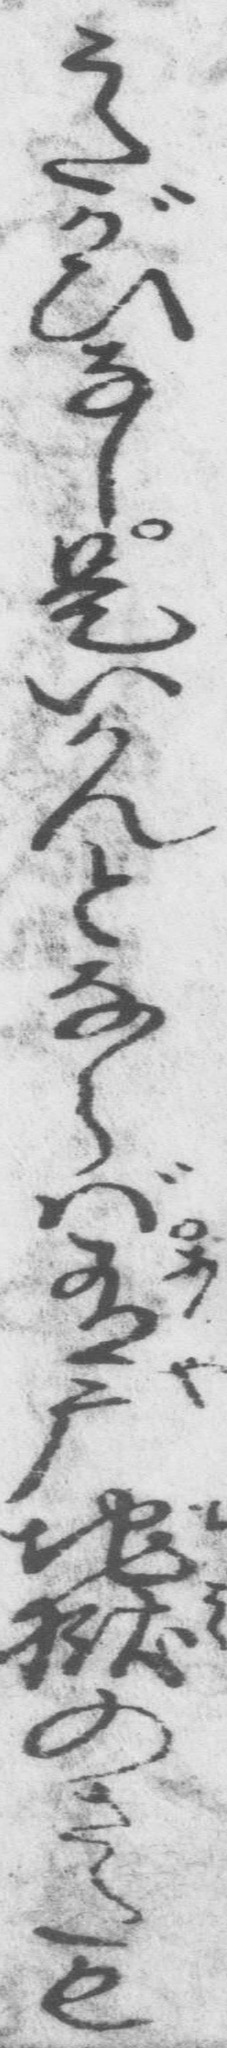うたがひなし。是いかんとならば。有屋？地獄のさたも
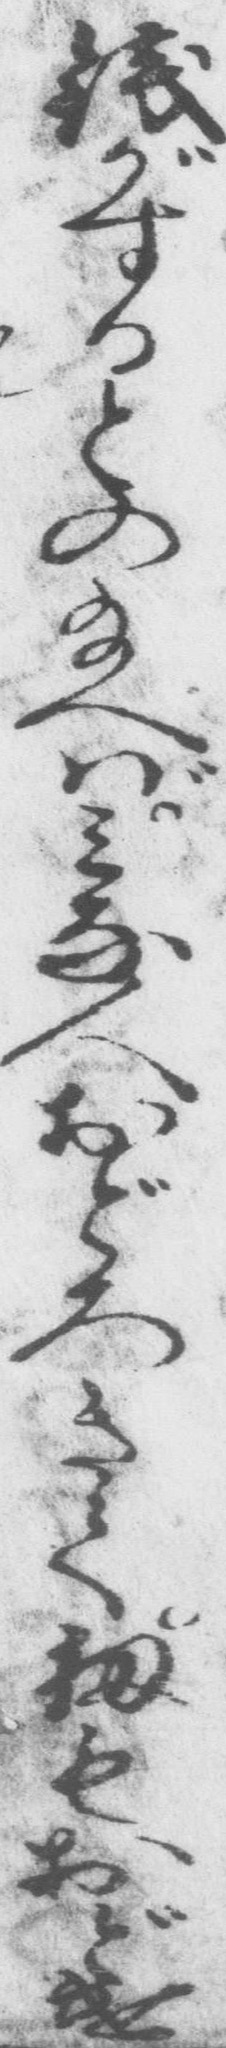銭がするとの給へば。みな人おどろきて、扨もおどけ
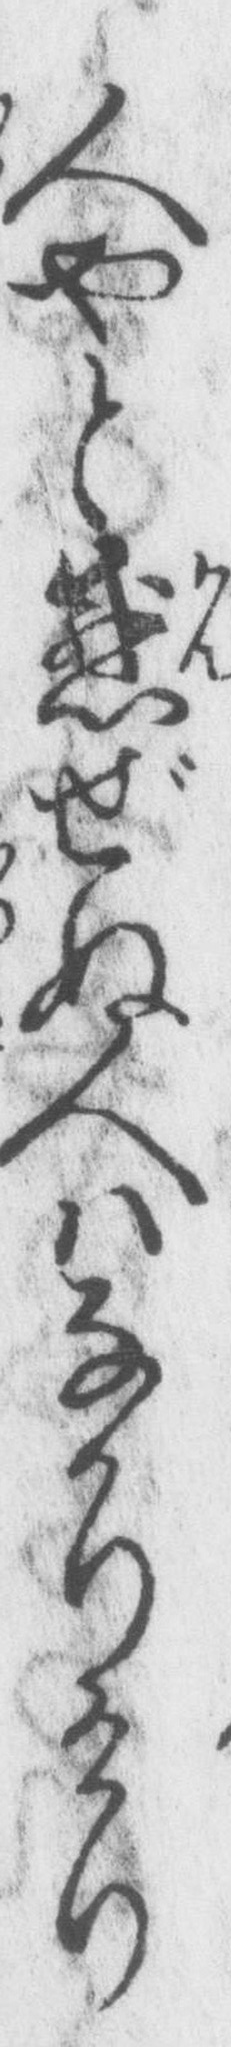人やと感ぜぬ人はなかりけり。
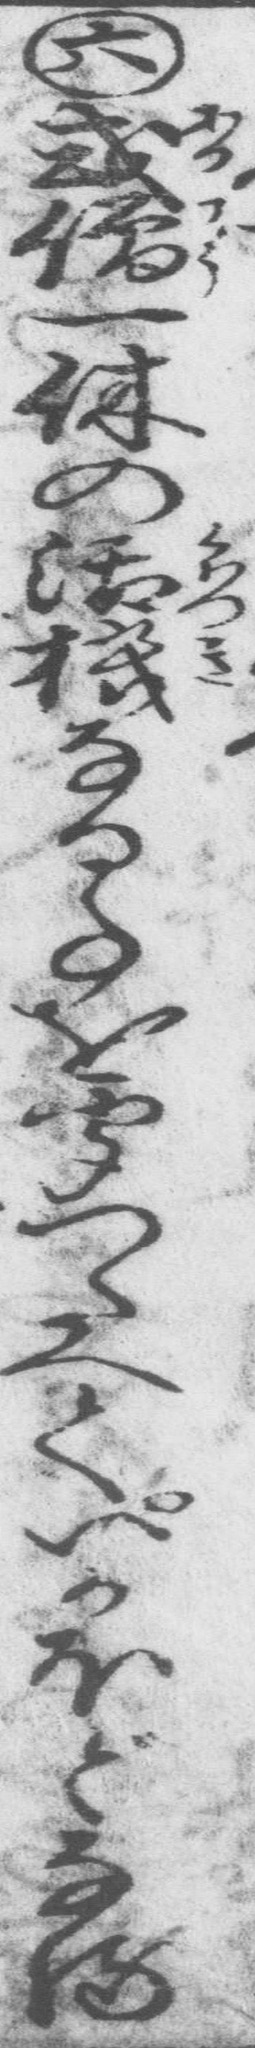『六』或僧一休の活機なる事を聞つたへて。いかほどなる
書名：一休はなし（元禄十三）
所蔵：大阪公立大学中百舌鳥図書館 国文学研究資料館
